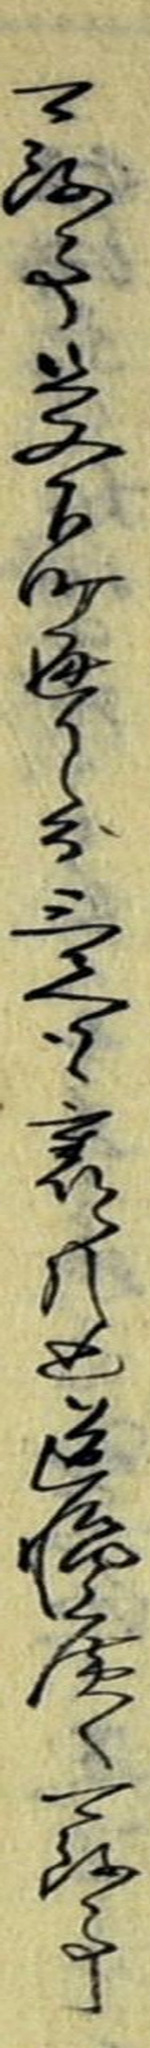可致事且又下町通り之分三尺つヽ裏へ引込道幅広く可致事

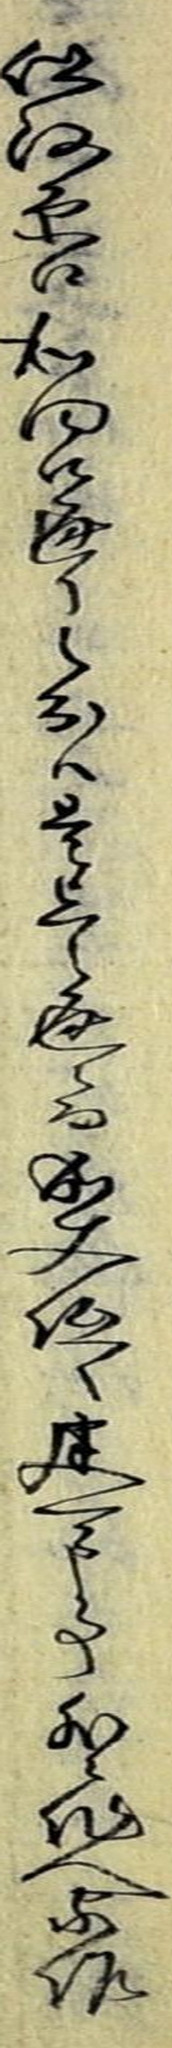但河原口和田口通り之分は是迄之通に而成丈他へ建可申事外之作人家作
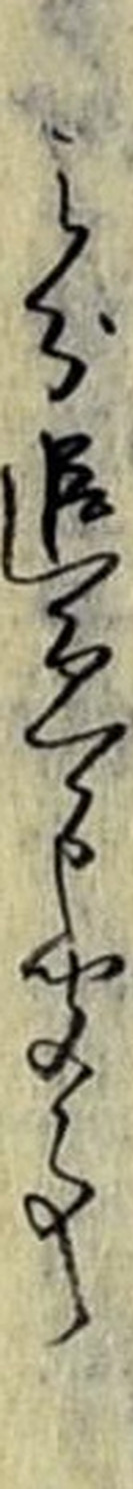之分追而可申聞事
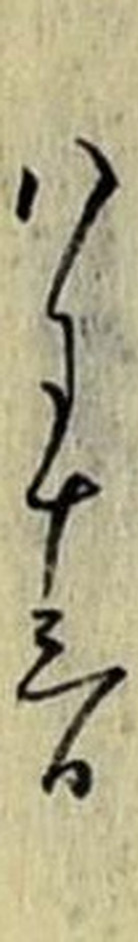八月十三日
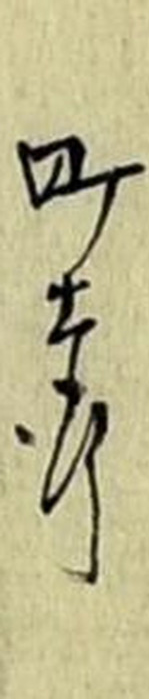町奉行
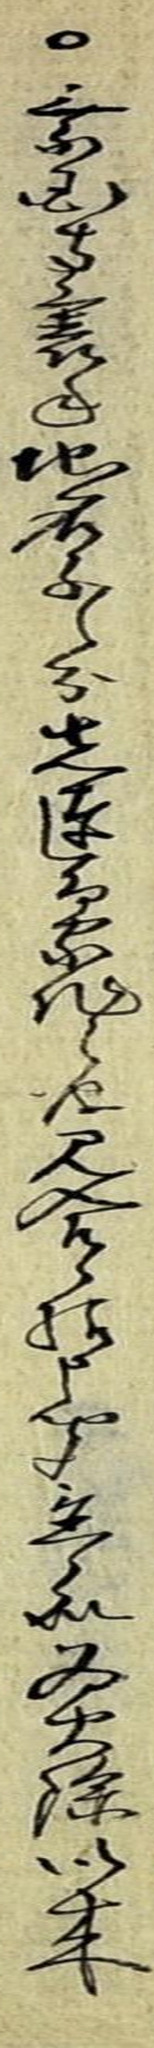○乗国寺裏手地名子之分先達而家作之儀見合候様申聞置候処為火除以来
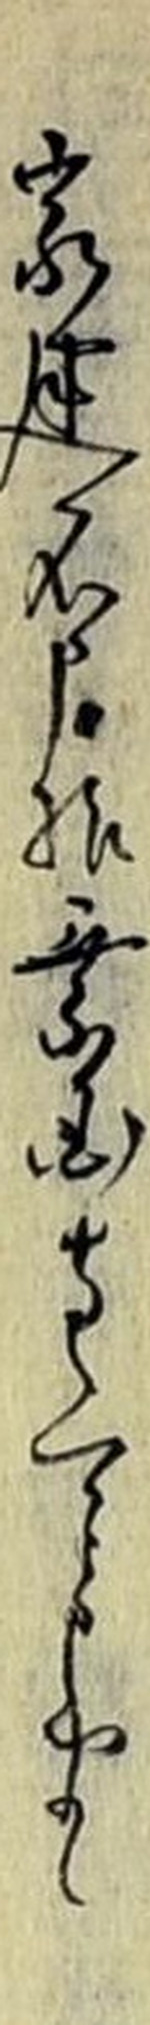家建不申様乗国寺へ可被申聞候
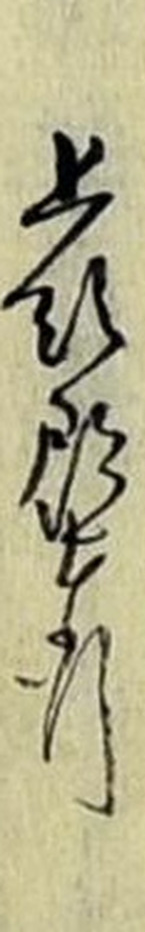上領郡奉行
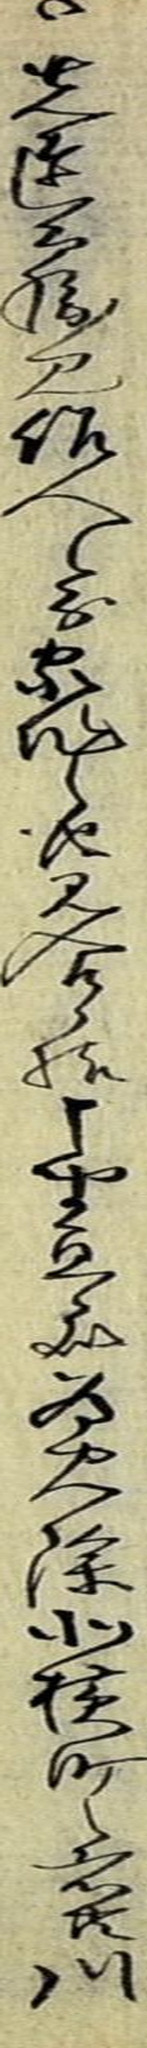○先達而勝見作人之分家作之儀見合候様申聞置候処為火除北横町之者共川
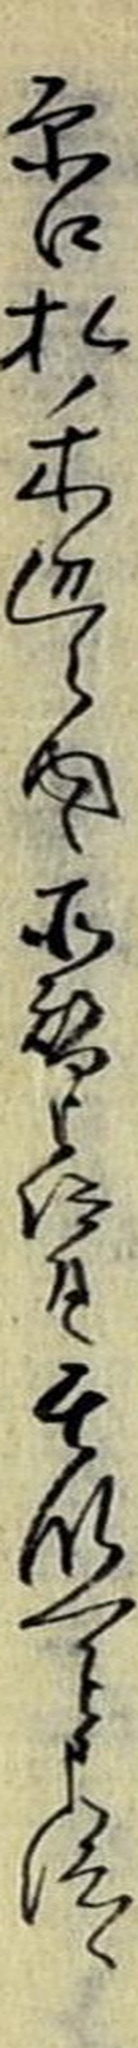原口松ノ木辺之内へ所替被仰付候其段可被申渡候
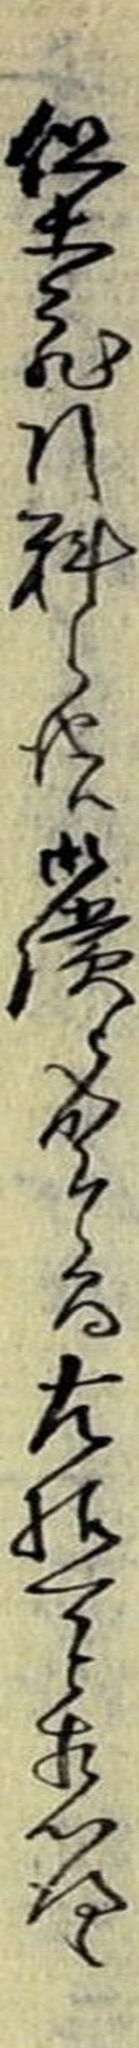但土蔵引料之儀は御償被成下候間左様可被相心得候
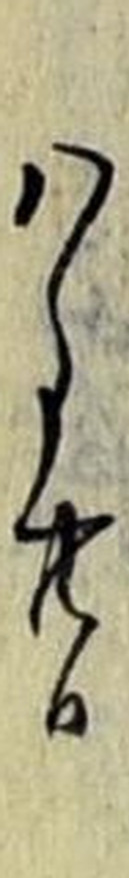八月廿日
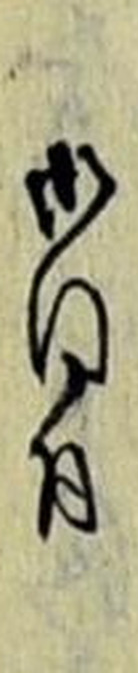御目付
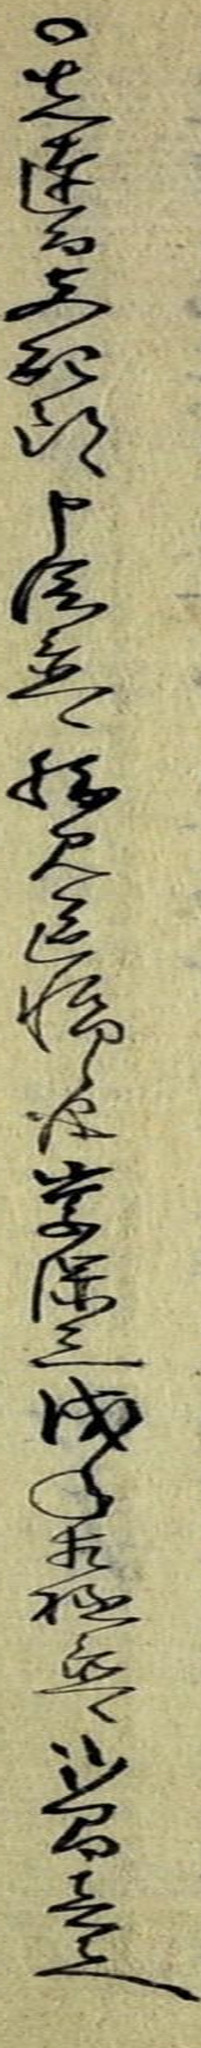○先達而支配頭へ申渡置候勝見道幅之儀享保三戌年相極置候弐間壱尺
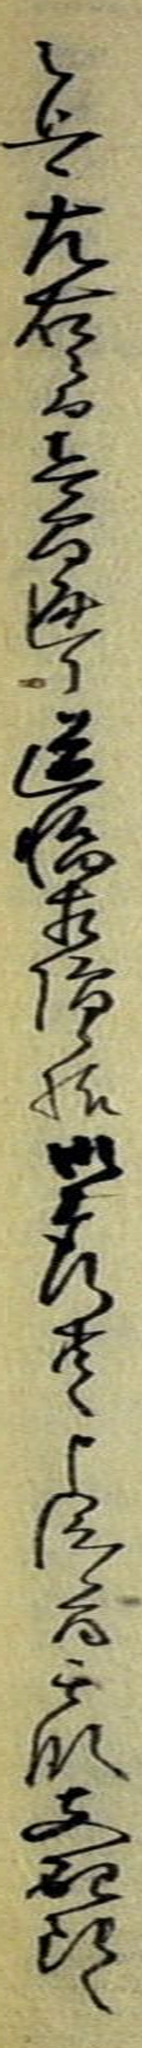之上へ左右に而壱間通り道幅相増候様御奉行共へ申渡候間其段支配頭へ
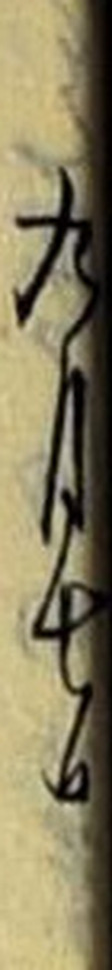九月七日
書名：命令之部 四
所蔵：福井県文書館 Fukui Prefectural Archives
